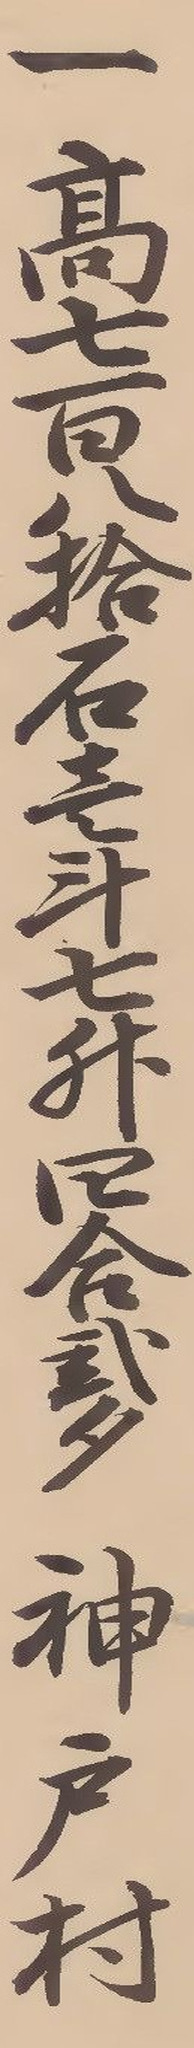一高七百八拾石壱斗七升四合弐勺神戸村
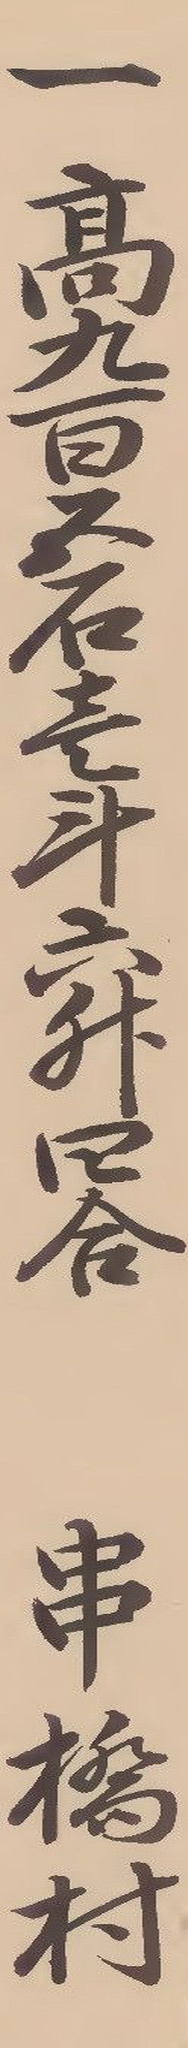一高九百五石壱斗六升四合串橋村
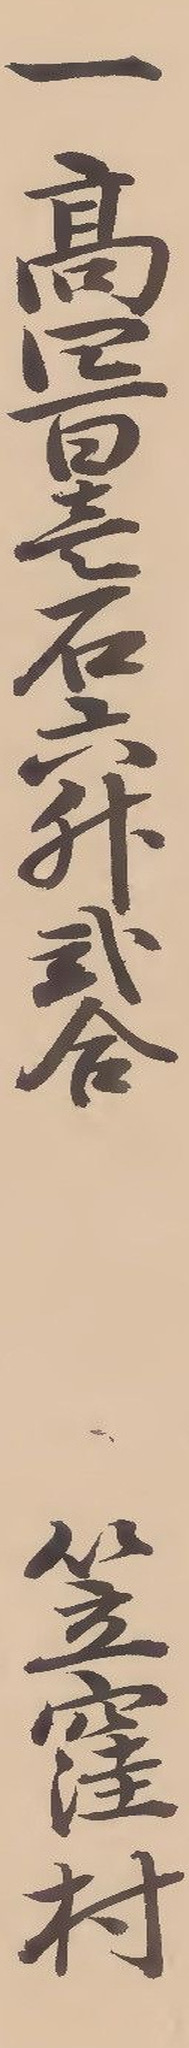一高四百壱石六升弐合笠窪村
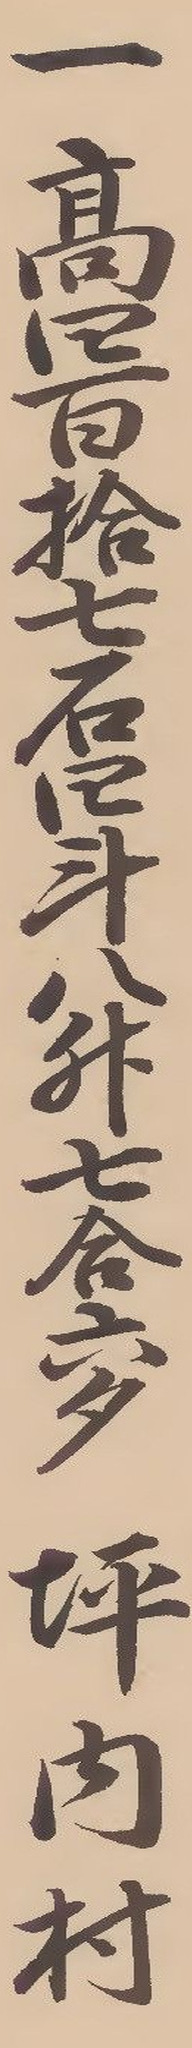一高四百拾七石四斗八升七合六勺坪内村

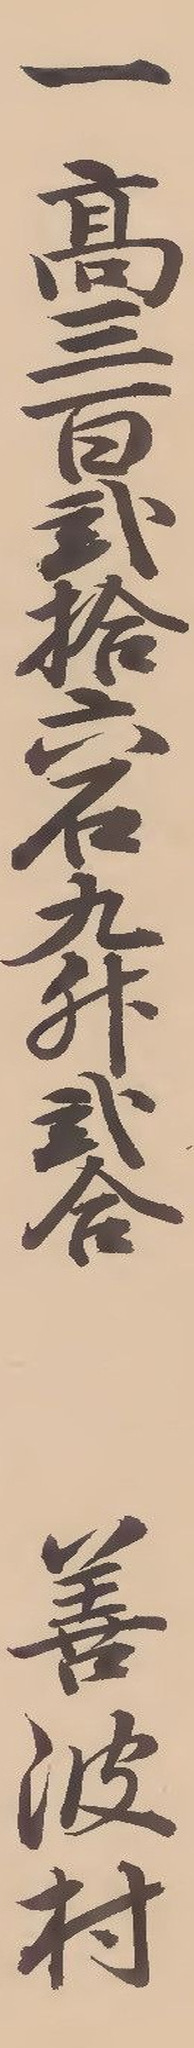一高三百弐拾六石九升弐合善波村
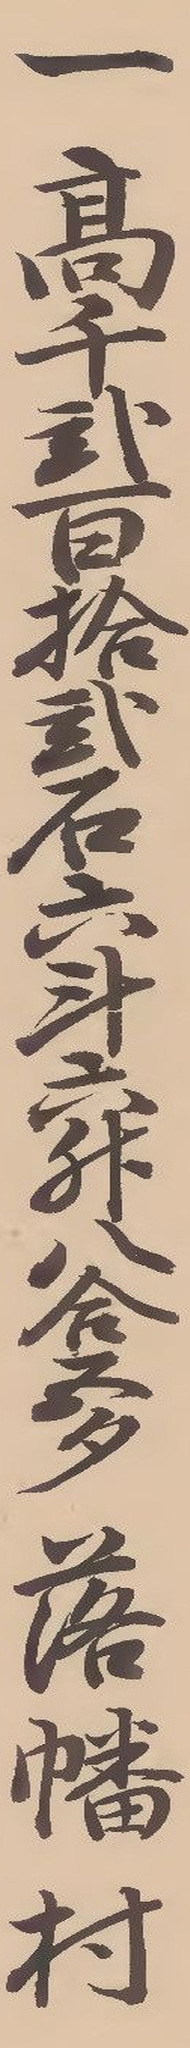一高千弐百拾弐石六斗六升八合五勺落幡村
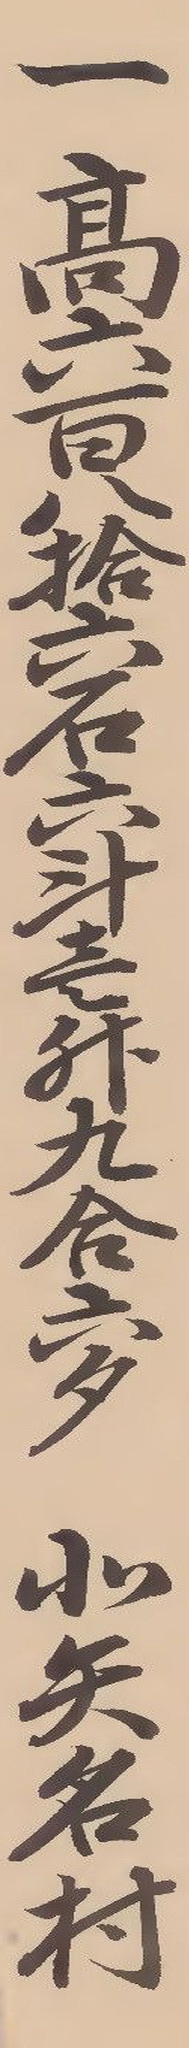一高六百八拾六石六斗壱升九合六勺北矢名村
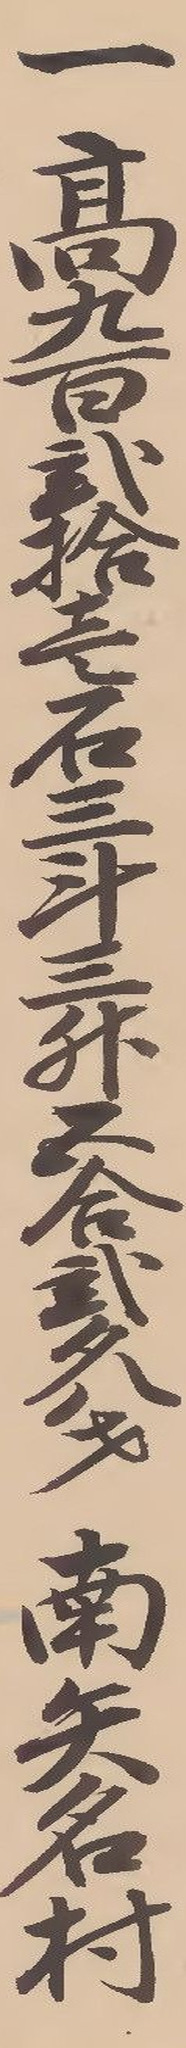一高九百弐拾壱石三斗三升五合弐勺八才南矢名村
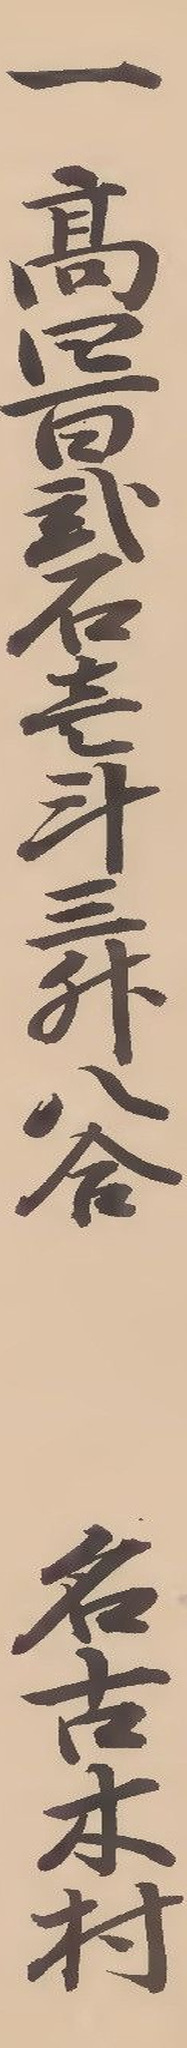一高四百弐石壱斗三升八合名古木村
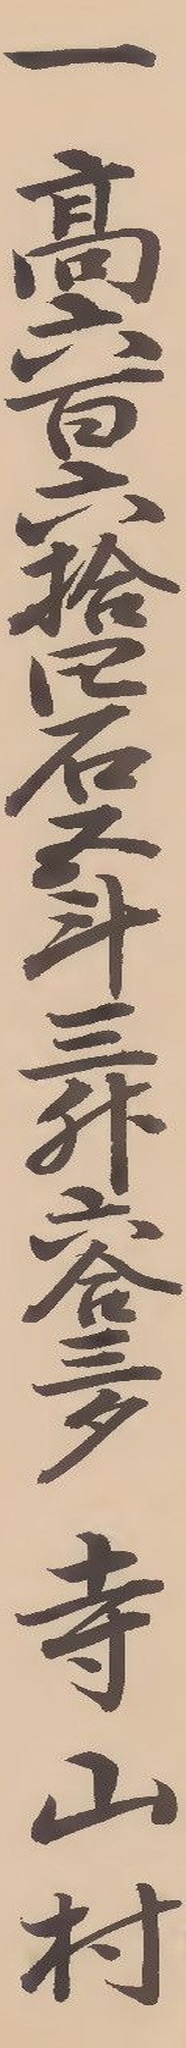一高六百六拾四石五斗三升六合三勺寺山村
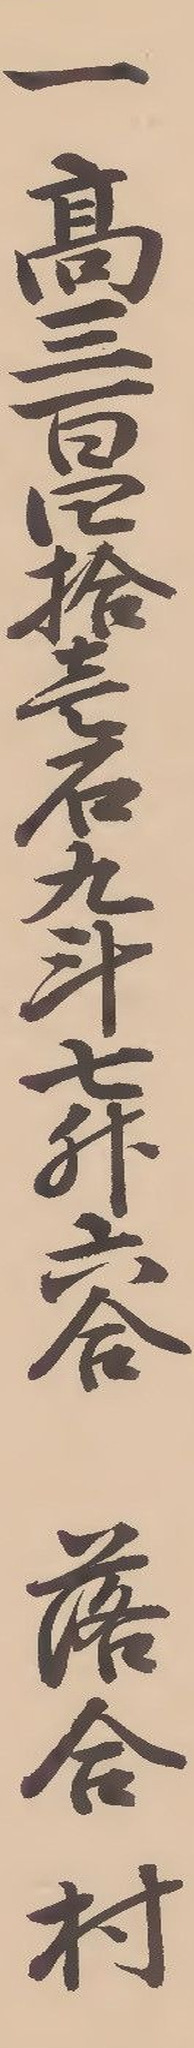一高三百四拾壱石九斗七升六合落合村
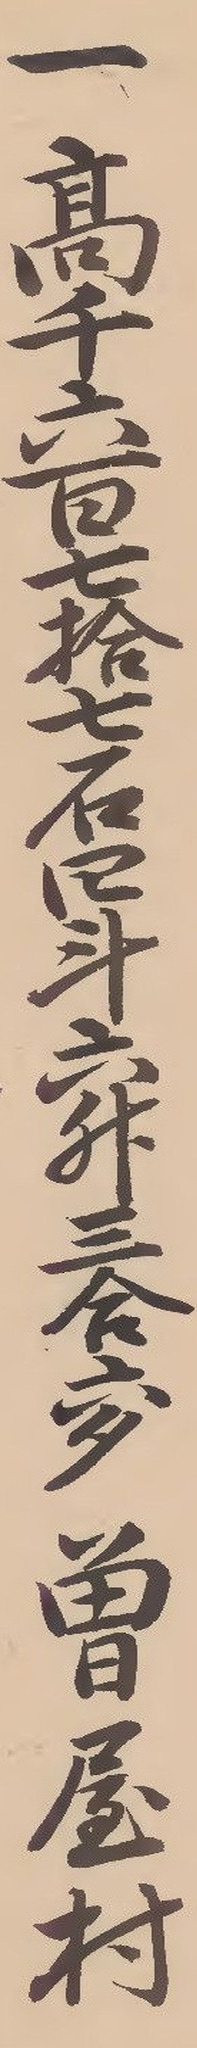一高千六百七拾七石四斗六升三合六勺曽屋村

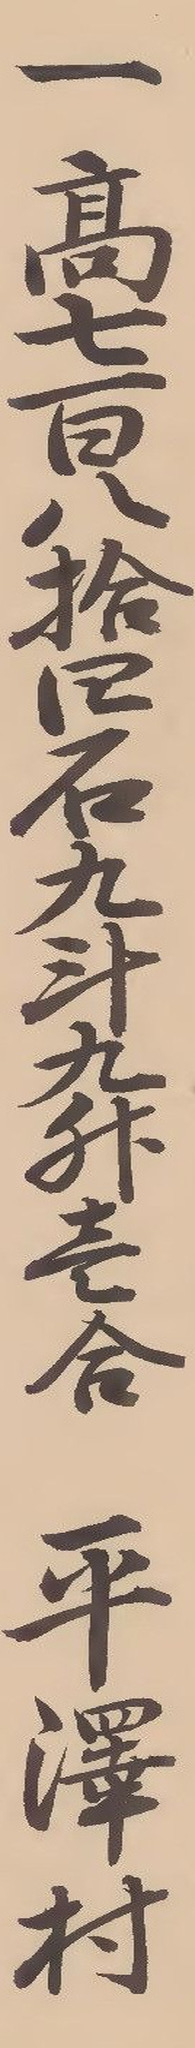一高七百八拾四石九斗九升壱合平澤村
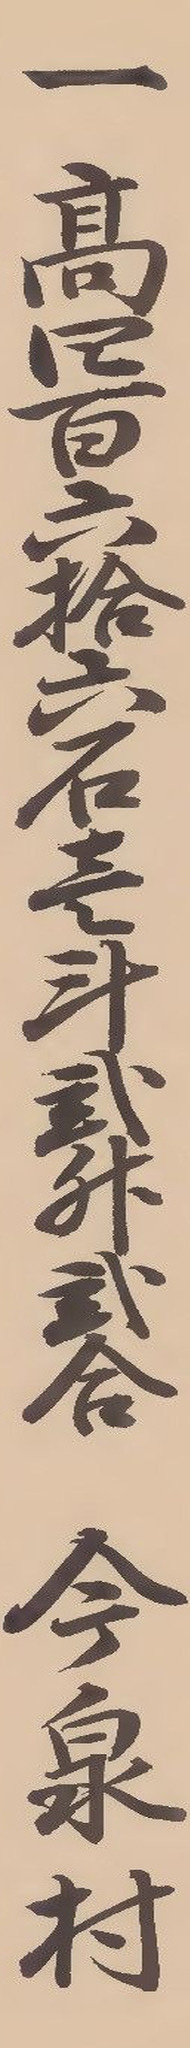一高四百六拾六石壱斗弐升弐合今泉村
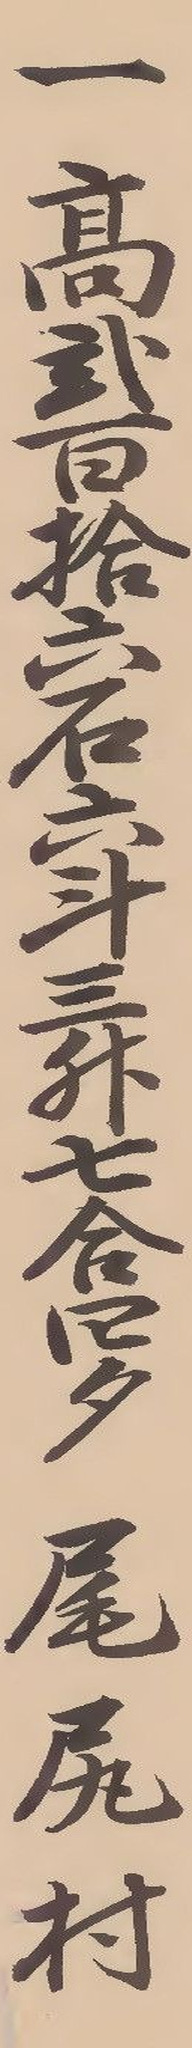一高弐百拾六石六斗三升七合四勺尾尻村
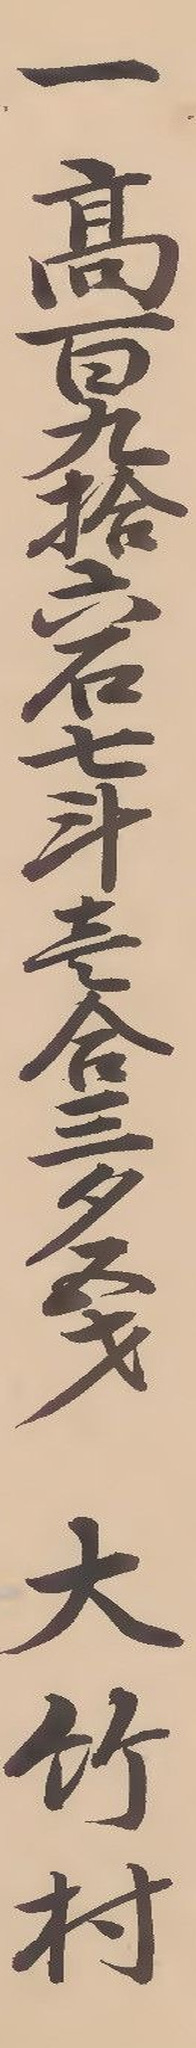一高百九拾六石七斗壱合三勺五才大竹村
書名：相模国郷帳
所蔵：国立公文書館 National Archives of Japan
